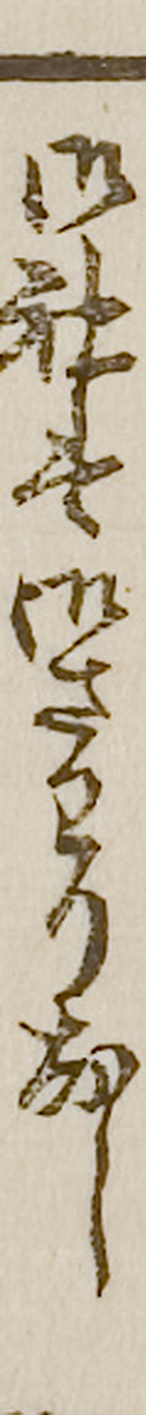御社は御さわりなし
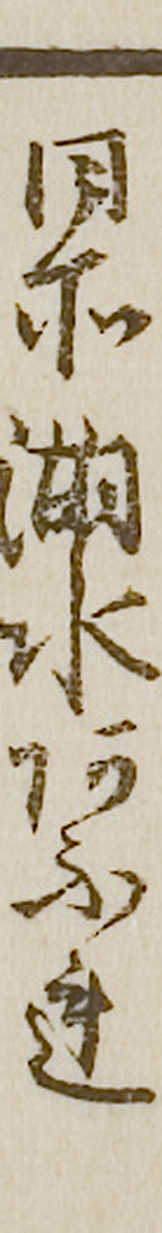同所満水あふれ
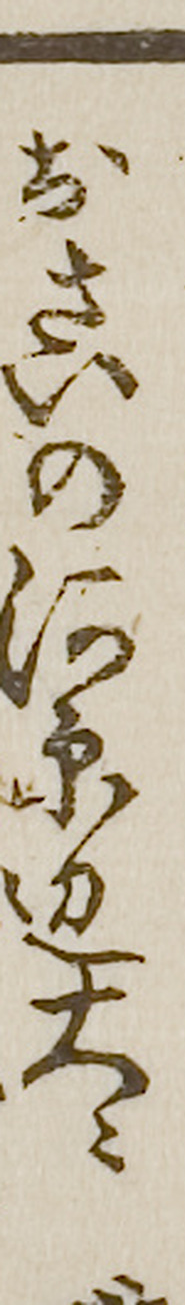おさいの河原辺大に
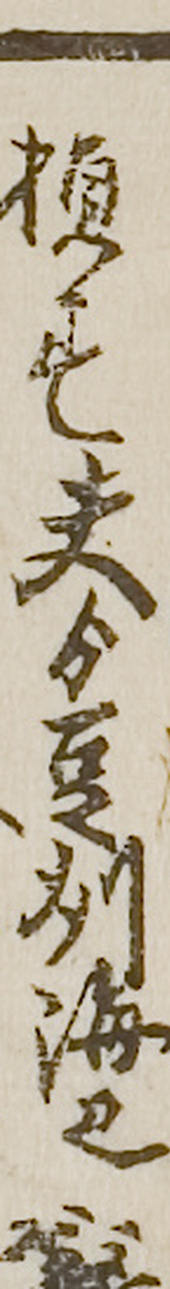損す夫ゟ豆州海辺
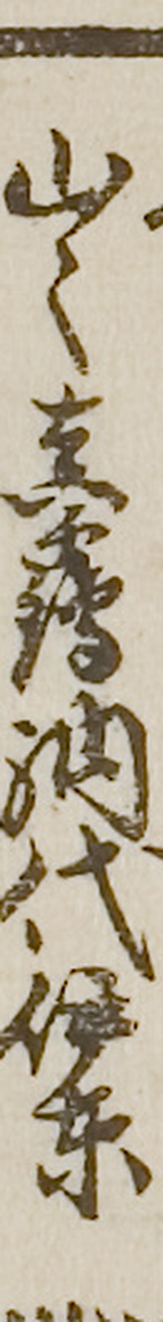山々真鶴網代伊東
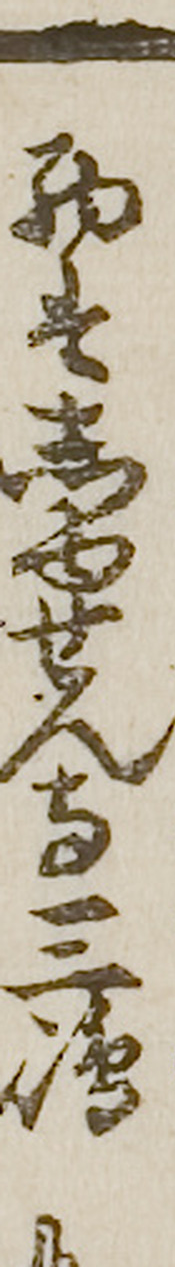西はしゆせん寺三嶋
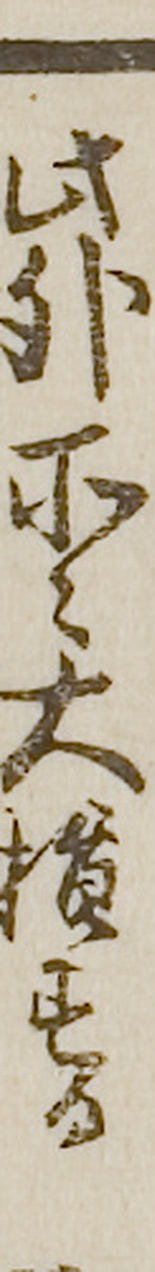此外所々大損する
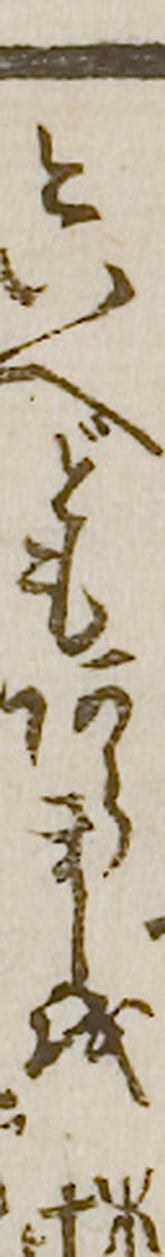といへどもあらましを
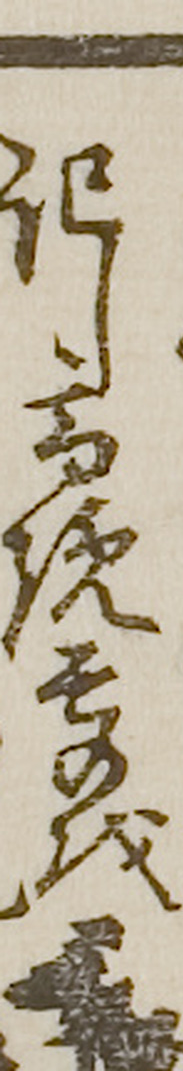記し高覧そのを
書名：出方山おしぬけ
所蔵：東京大学総合図書館 General Library in the University of Tokyo, JAPAN
